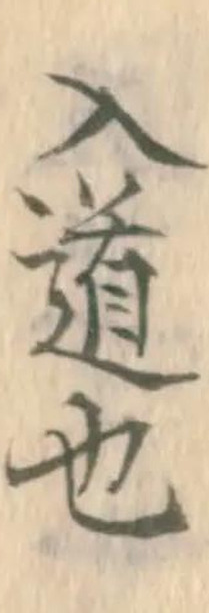入道也
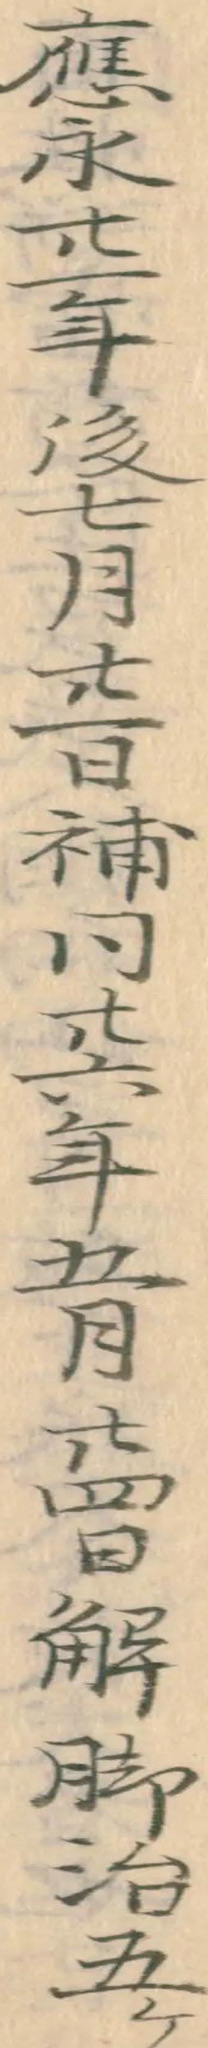応永廿一年後七月廿一日補同廿六年五月廿四日解脚治五ケ
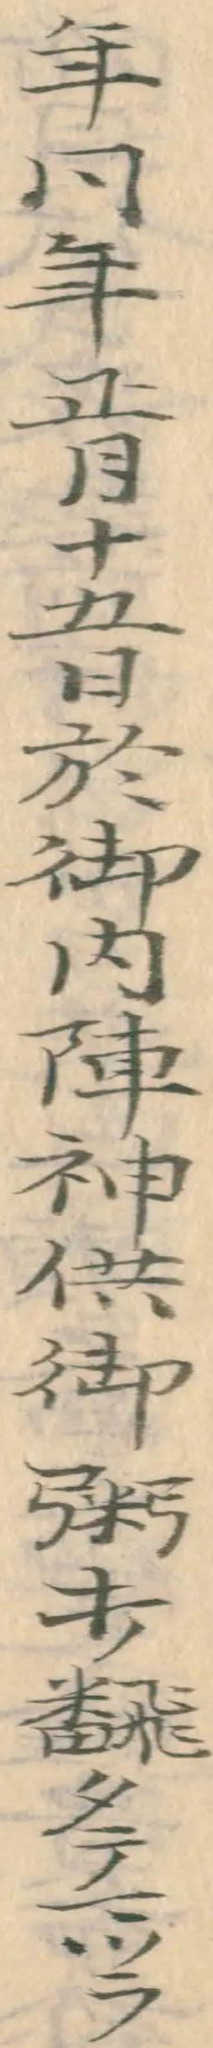年同年正月十五日於御内陣神供御粥打翻タテマツラ
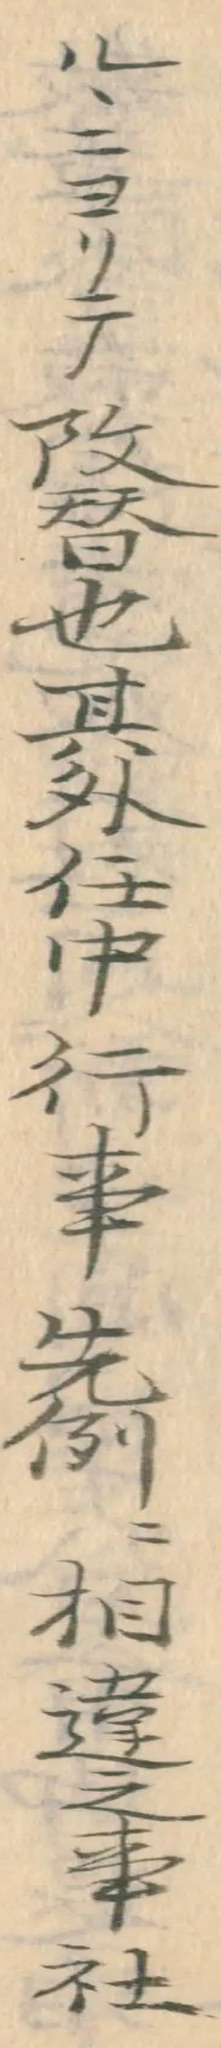ルヽニヨリテ改替也其外任中行事先例ニ相違之事社
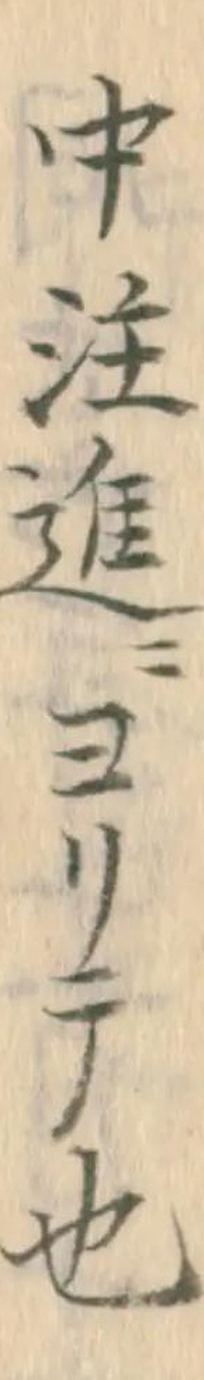中注進ニヨリテ也
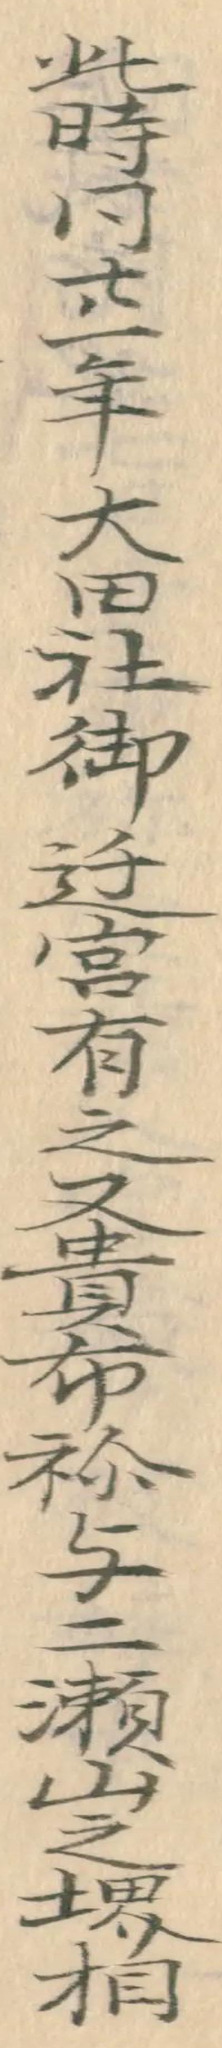此時同廿一年大田社御遷宮有之又貴布祢与二瀬山之堺相
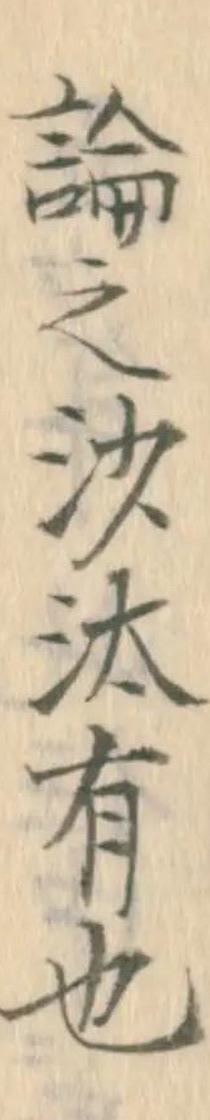論之沙汰有也
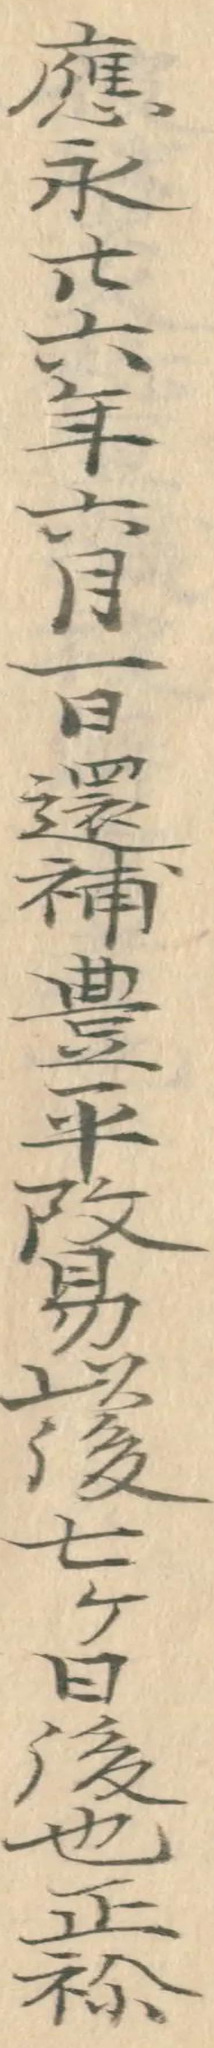応永廿六年六月一日還補豊平改易以後七ケ日後也正祢
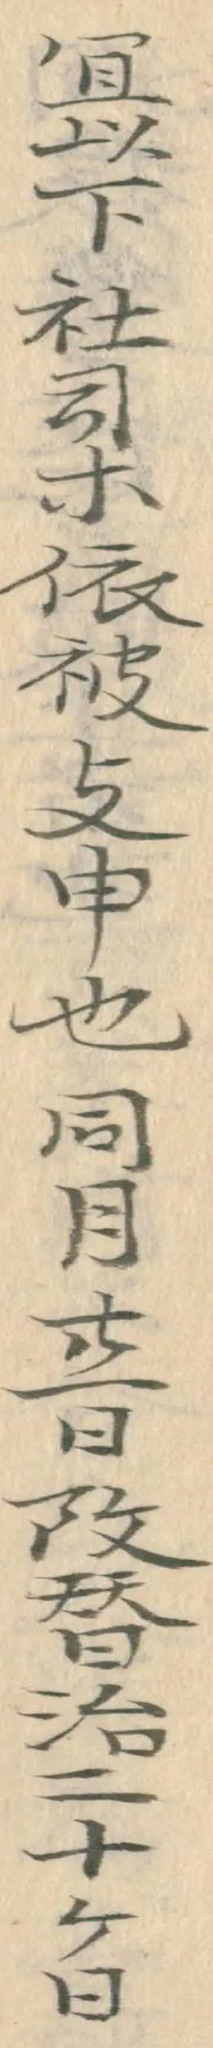宜以下社司等依被支申也同月廿一日改替治二十ケ日
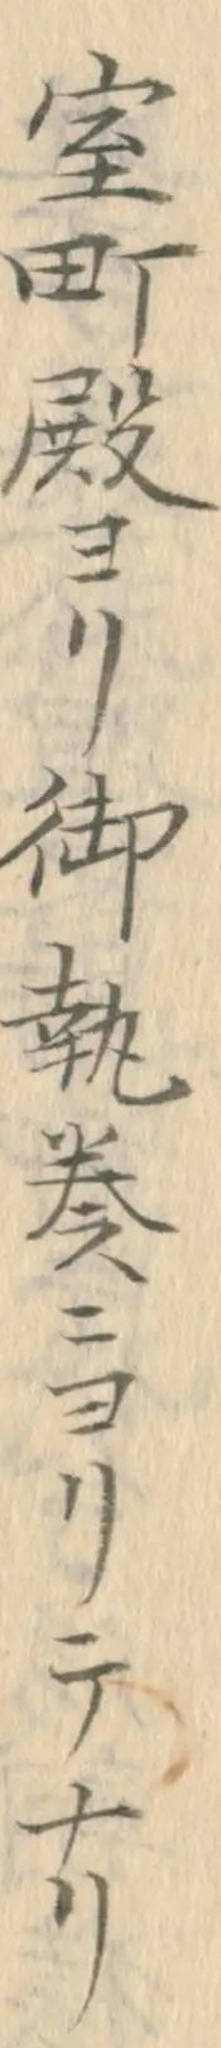室町殿ヨリ御執奏ニヨリテナリ

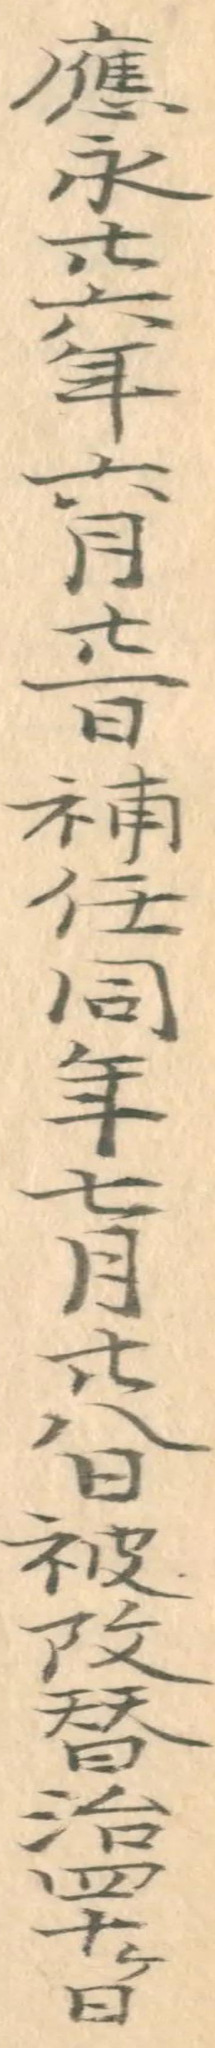応永廿六年六月廿一日補任同年七月廿八日被改替治四十ケ日
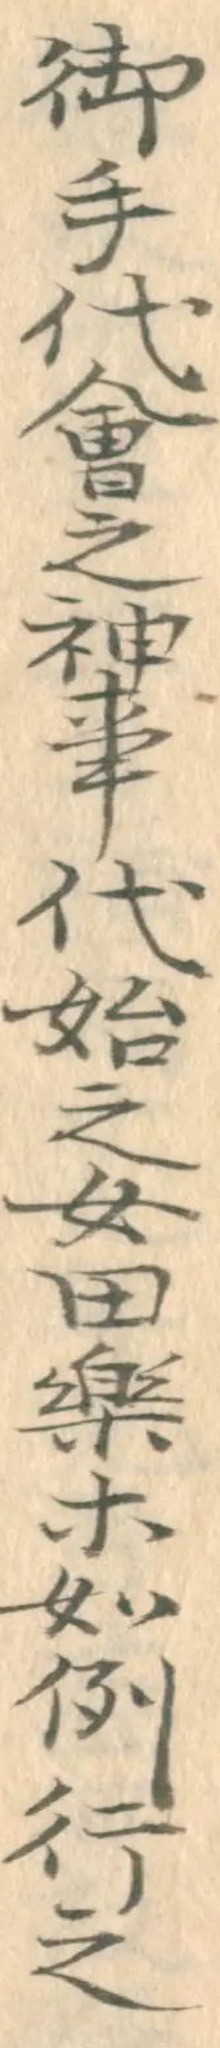御手代会之神事代始之女田楽等如例行之
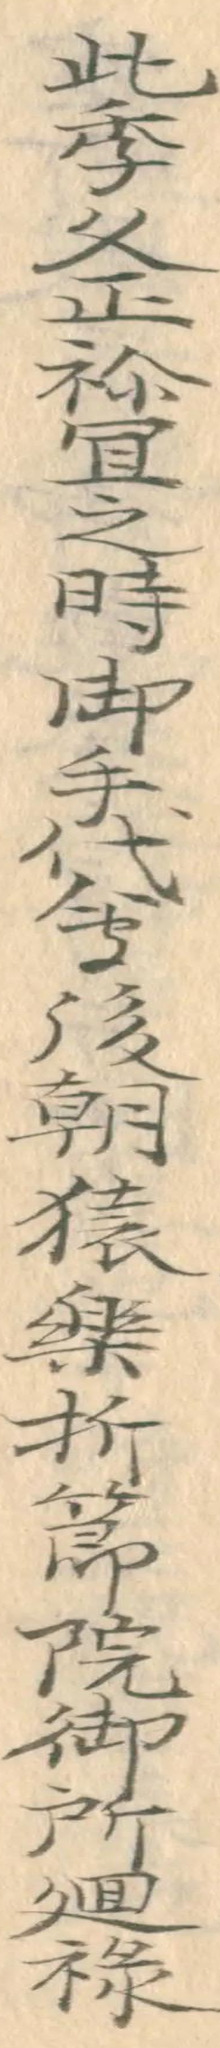此季久正祢宜之時御手代会後朝猿楽折節院御所廻禄
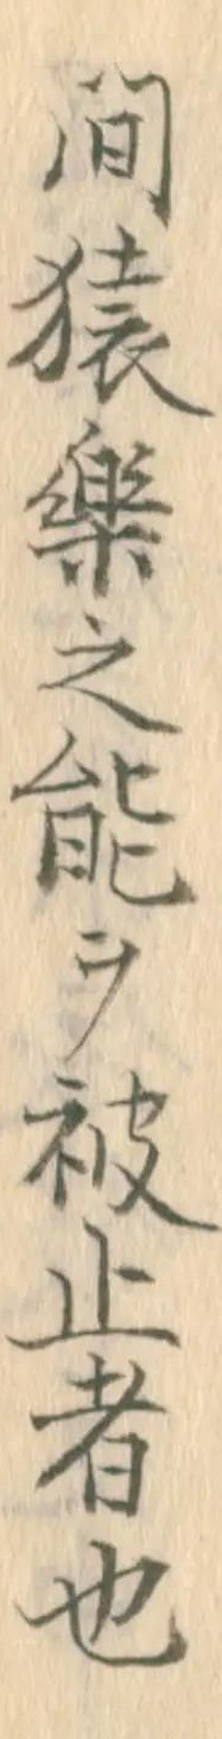間猿楽之能ヲ被止者也
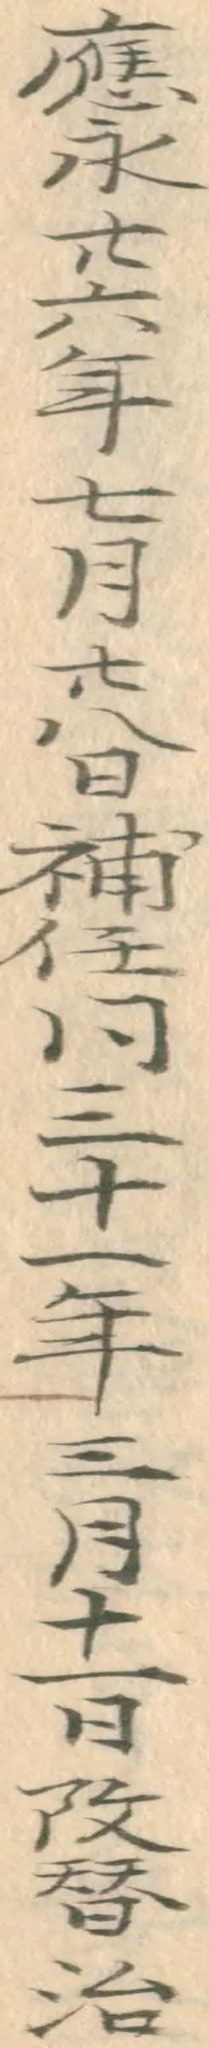応永廿六年七月廿八日補任同三十一年三月十一日改替治
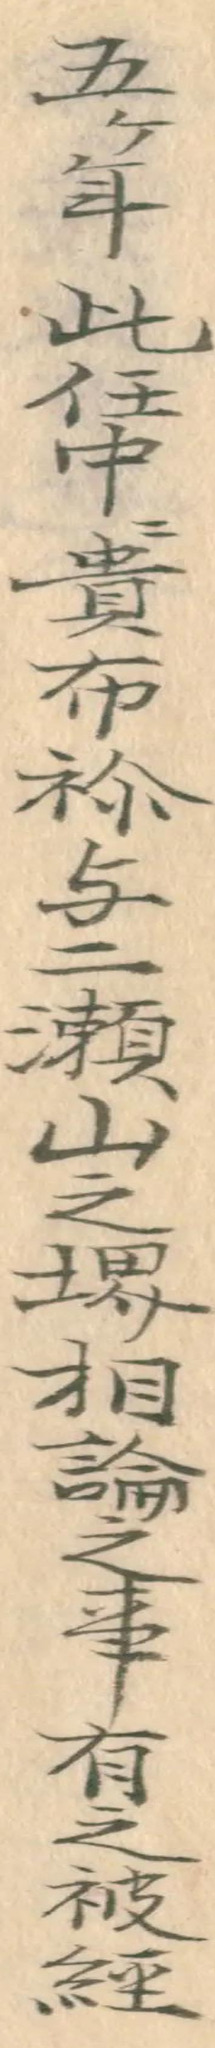五ケ年此任中ニ貴布祢与二瀬山之堺相論之事有之被経
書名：賀茂社記録. 第24冊
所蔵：国立国会図書館 National Diet Library, JAPAN
